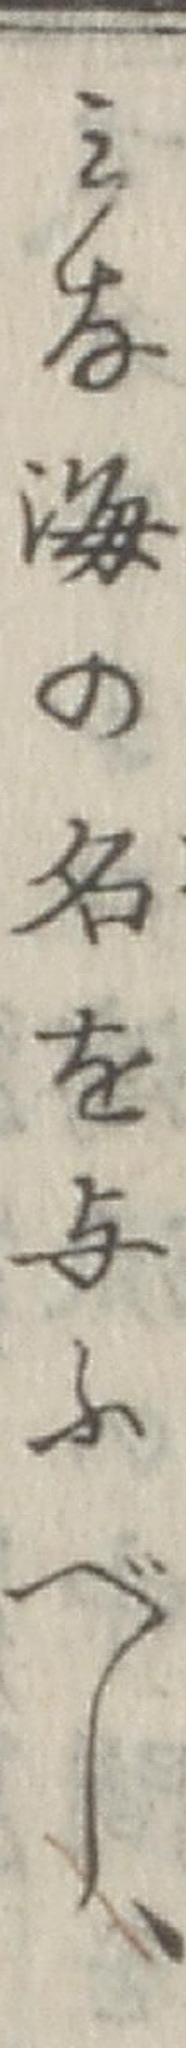みな海の名を与ふべし、
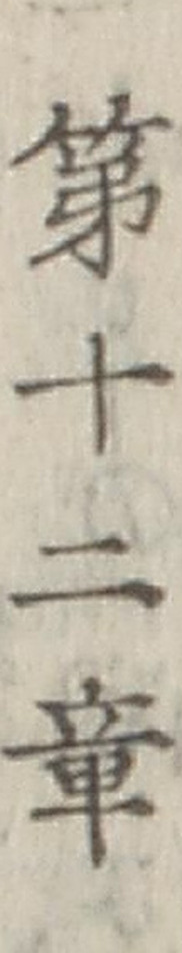第十二章
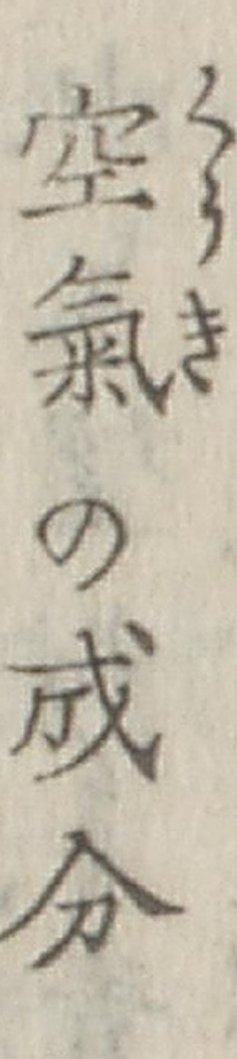空気の成分
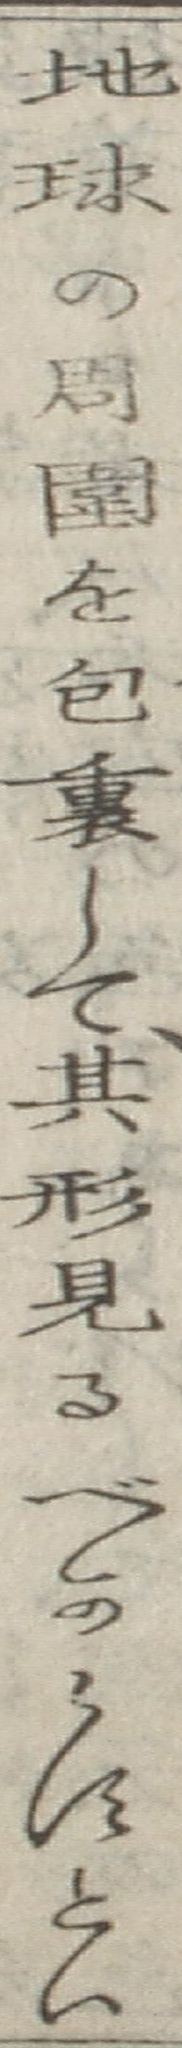地球の周囲を包裏して、其形見るべからすとい
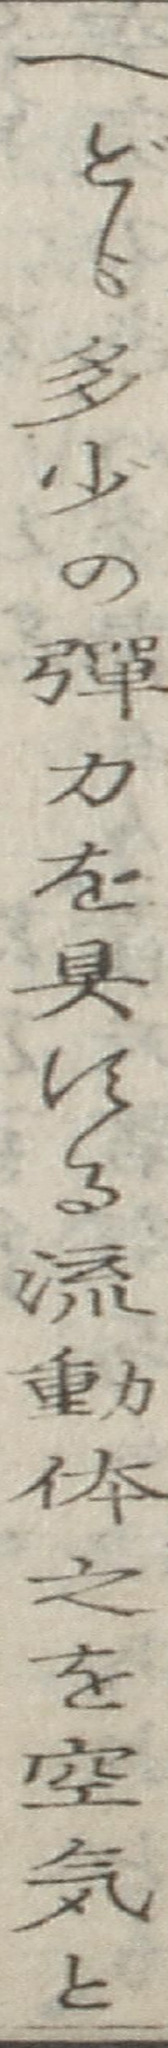へども、多少の弾力を具する流動体、之を空気と
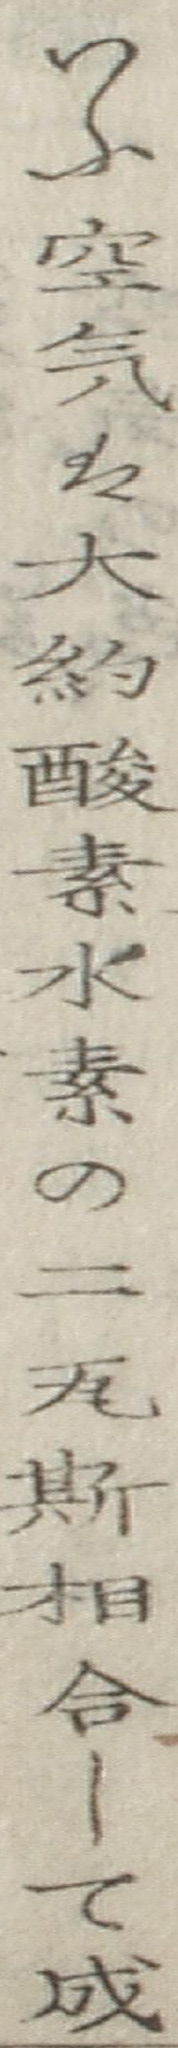いふ、空気は大約酸素、水素の二瓦斯相合して、成
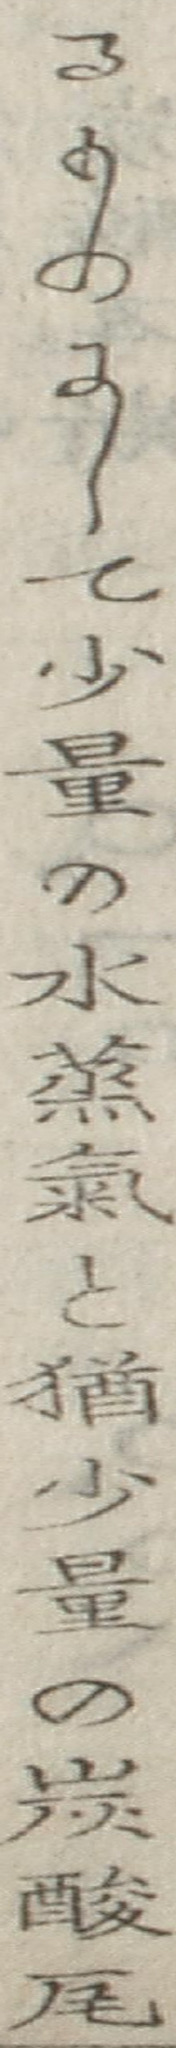るものにして、少量の水蒸気と、猶少量の炭酸瓦
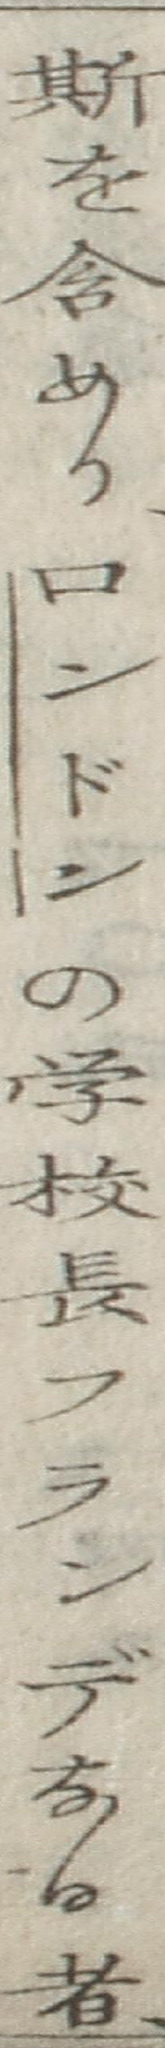斯を含めり、ロンドンの学校長フランデなる者、
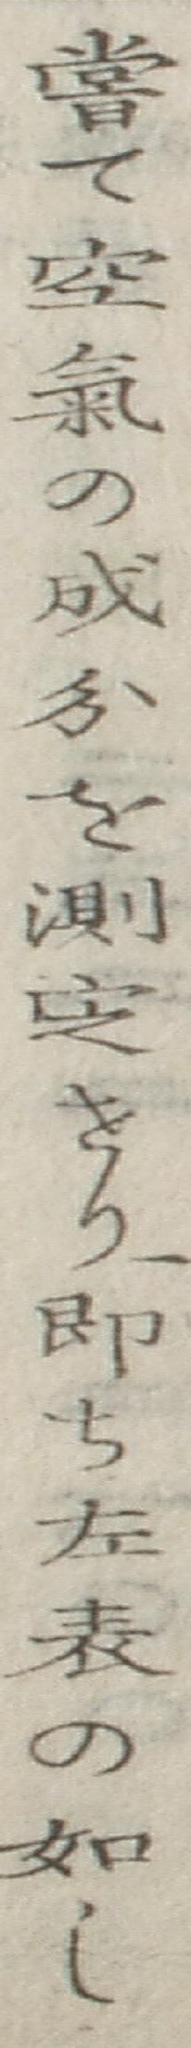嘗て空気の成分を測定せり、即ち左表の如し

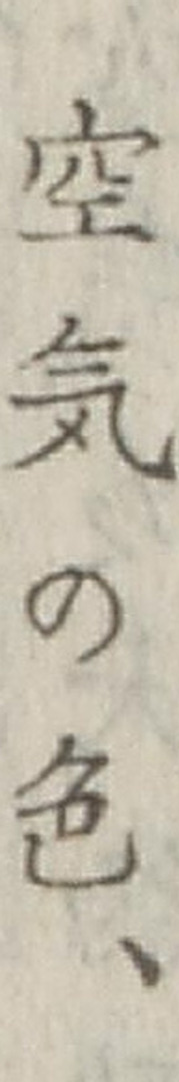空気の色、
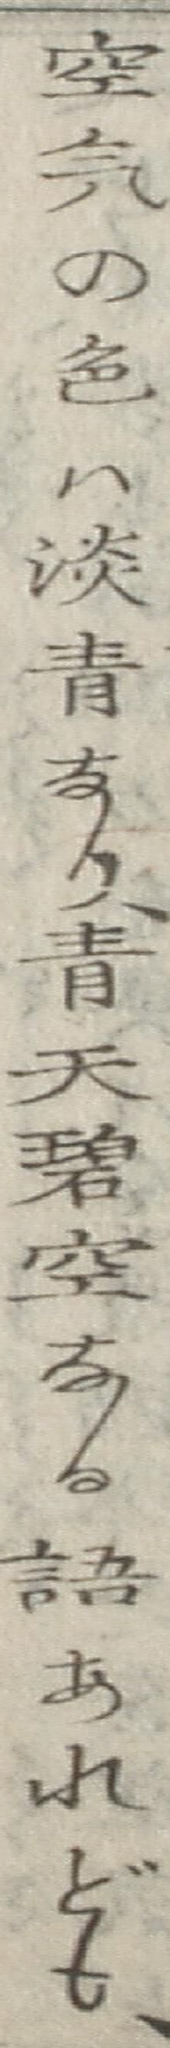空気の色は淡青なり、晴天碧空なる語あれども、
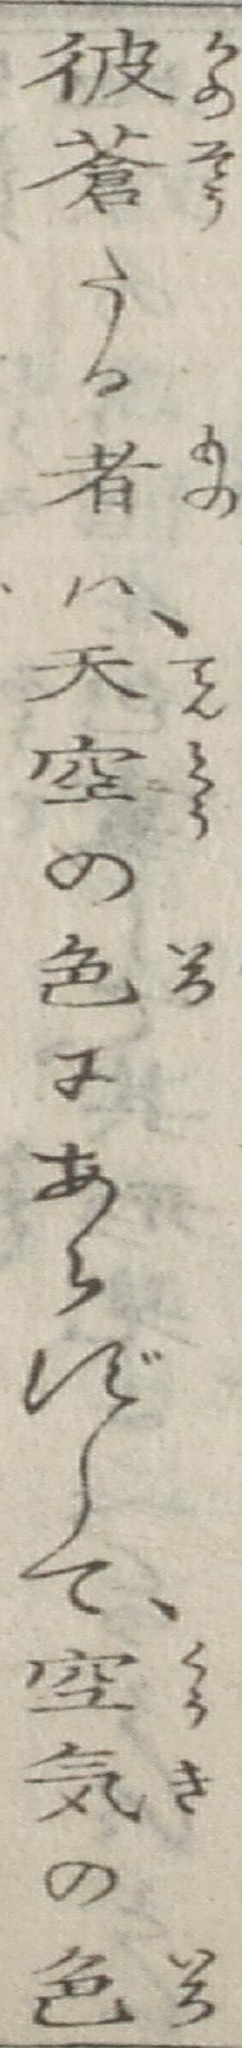彼蒼たる者は、天空の色にあらずして、空気の色
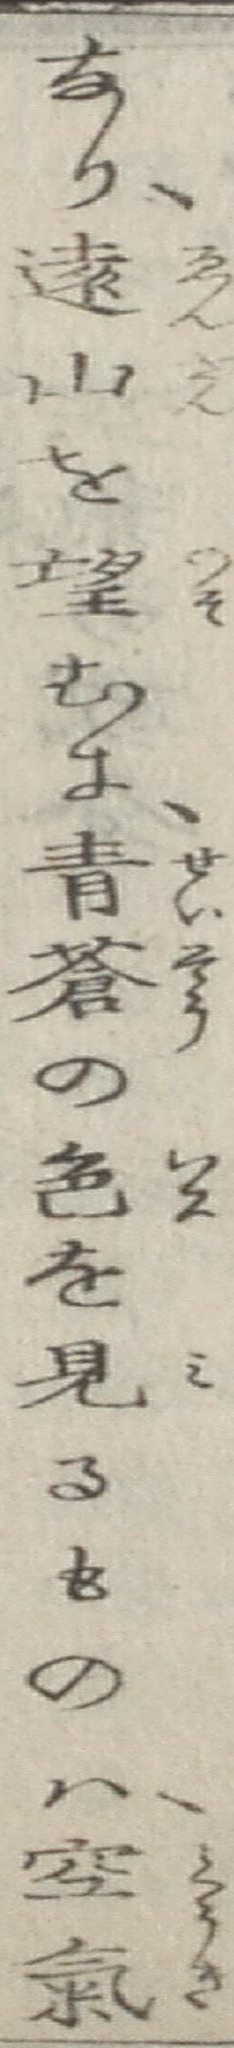なり、遠山を望むに、青蒼の色を見るものは、空気
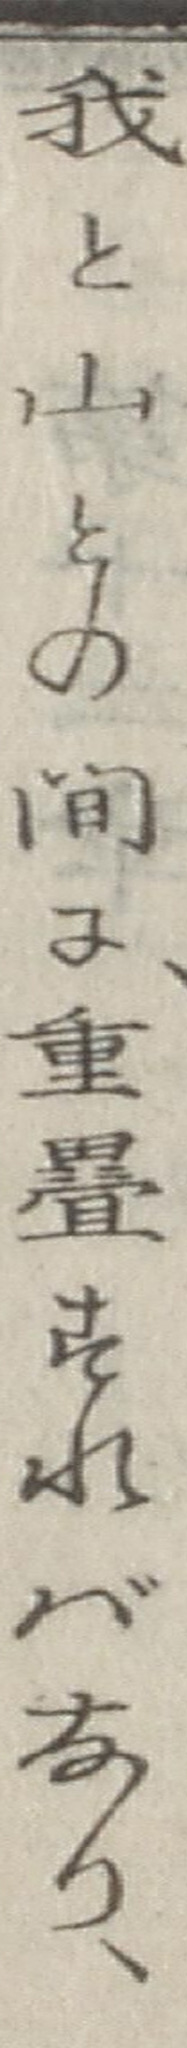我と山との間に、重畳すればなり、
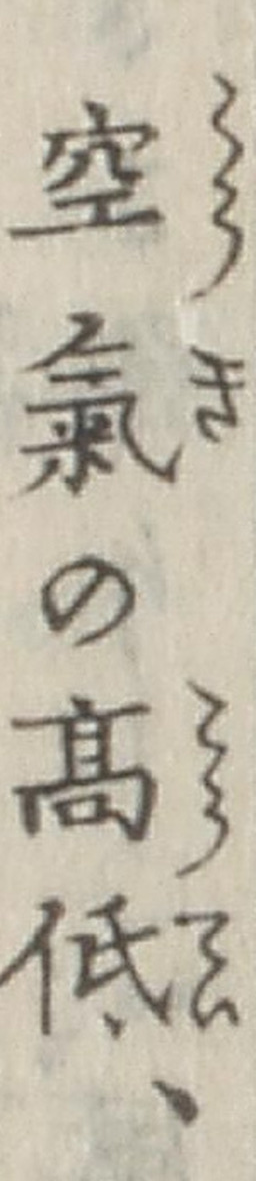空気の高低、
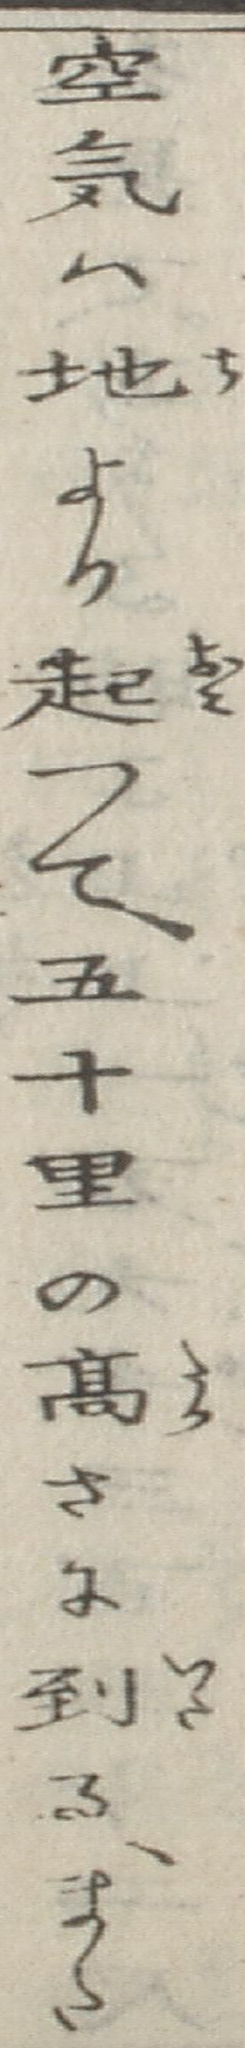空気は地より起つて、五十里の高さに到る、また
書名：訓蒙　天然地理學　中
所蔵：東京大学地震研究所図書室 Earthquake Research Institute Library, The University of Tokyo, JAPAN
